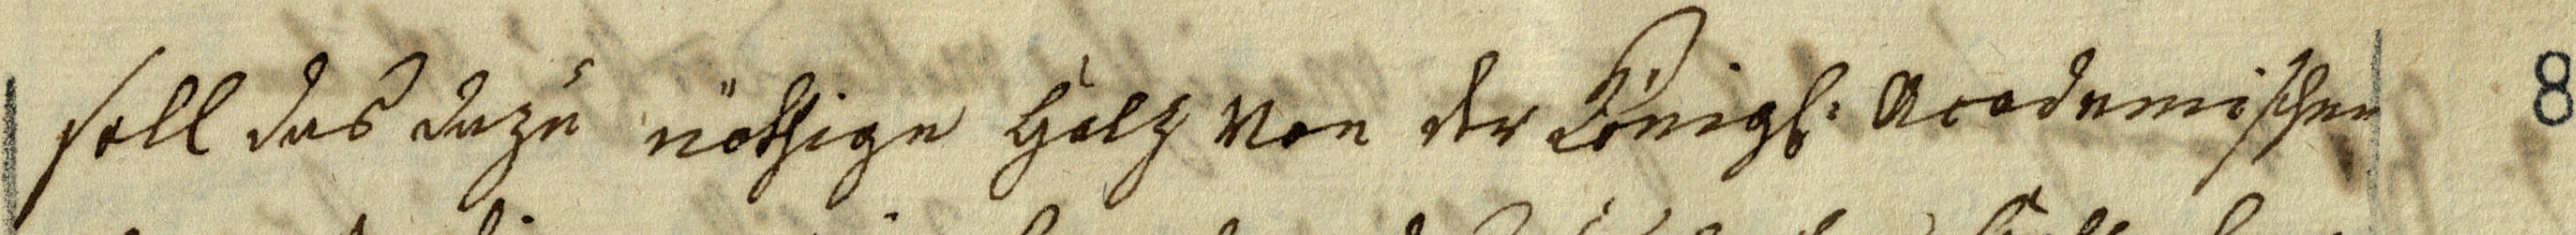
soll das dazu nöthige Holz von der Königl. Akademischen
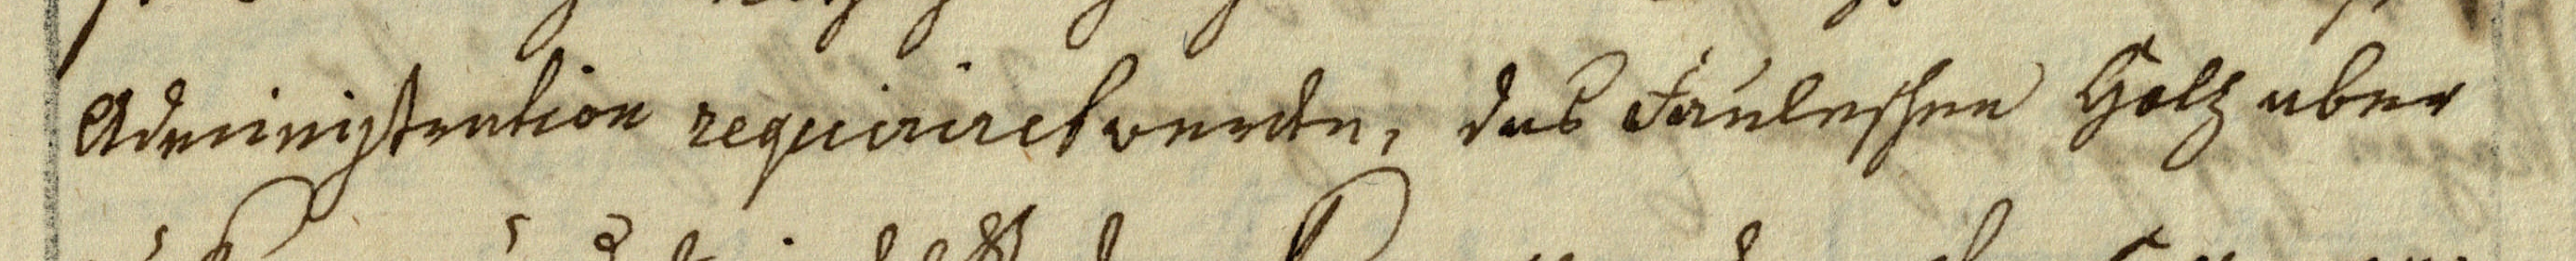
Administration requiriret werden, das Fauleschen Holz aber
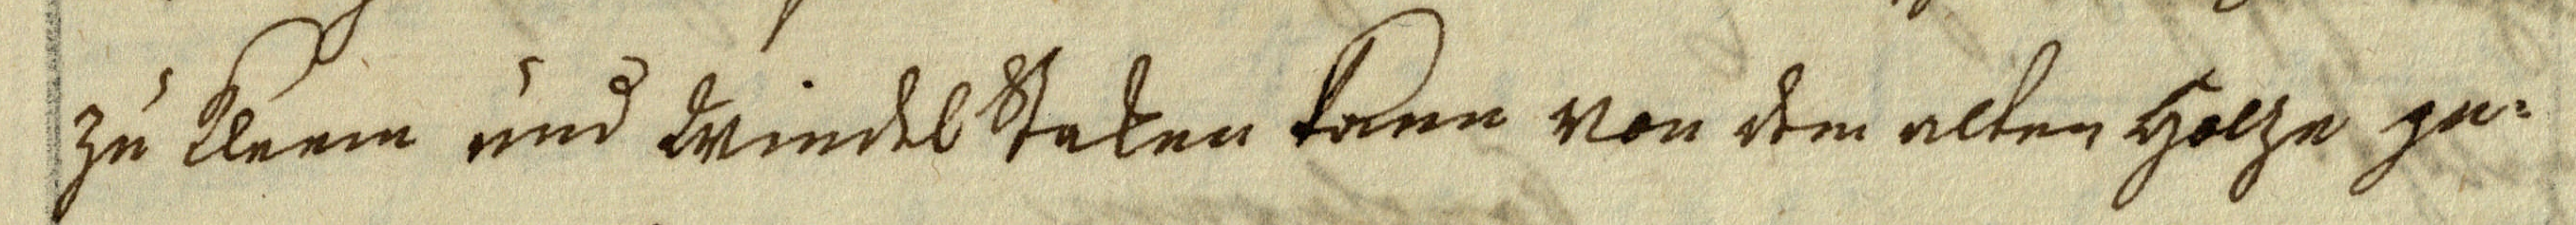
zu Kleine und Windel Staken kann von dem alten Holze ge¬
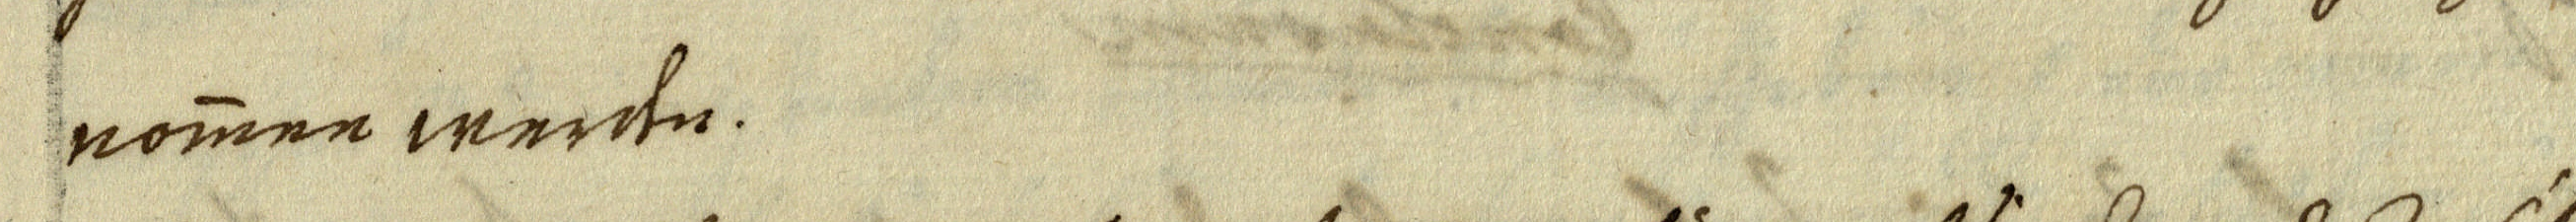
nomen werden.
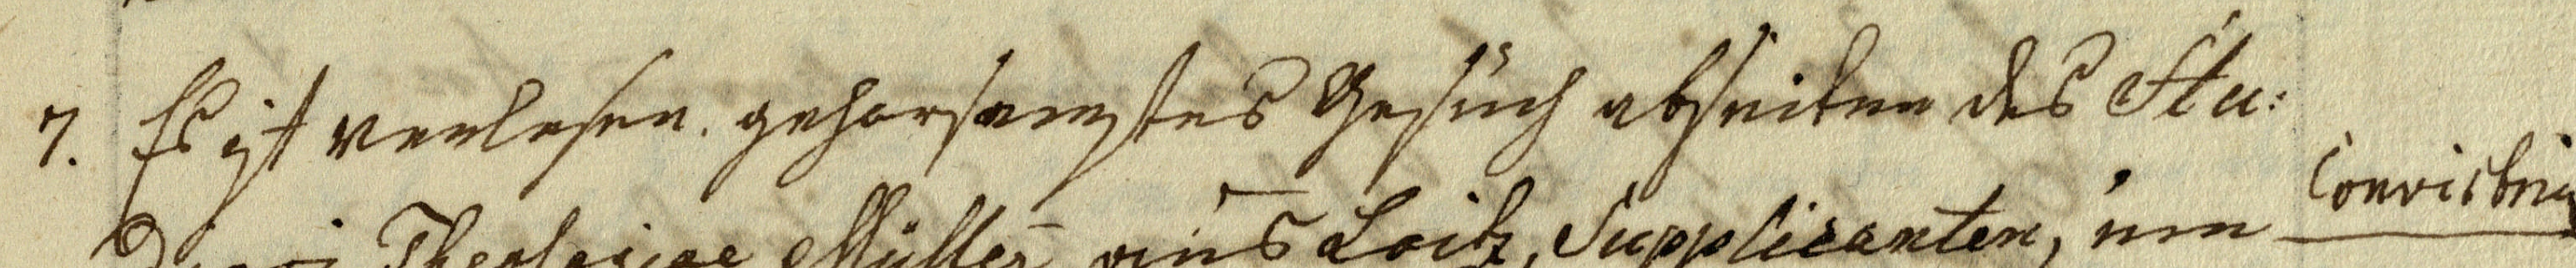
7. Es ist verlesen gehorsamstes Gesuch abseiten des Stu¬
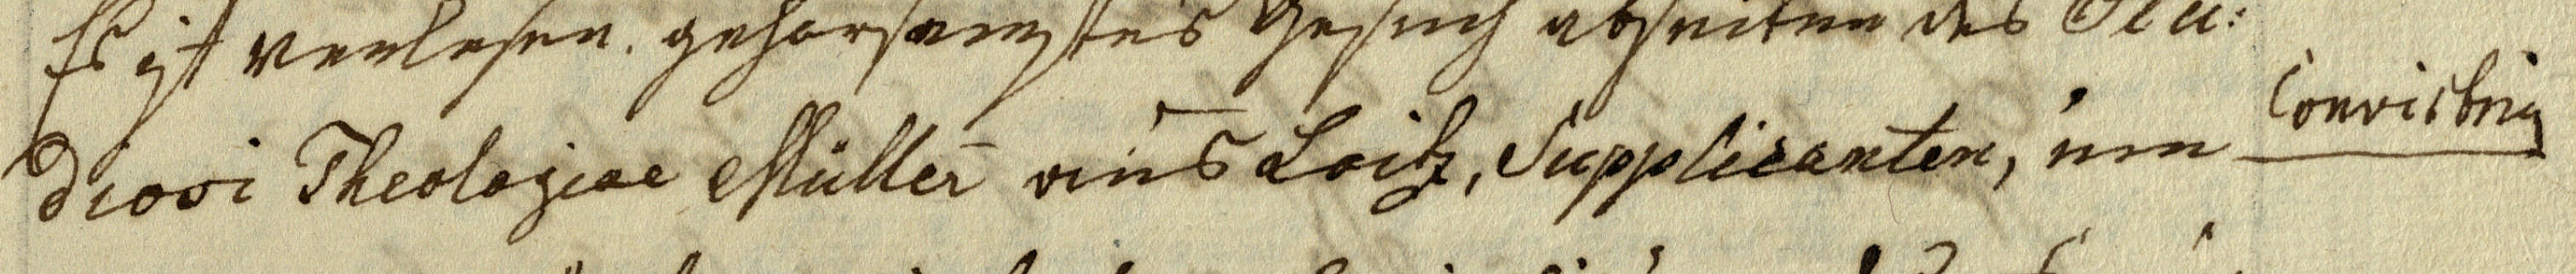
diosi Theologiae Müller aus Loitz, Supplicanten, um Convictrum
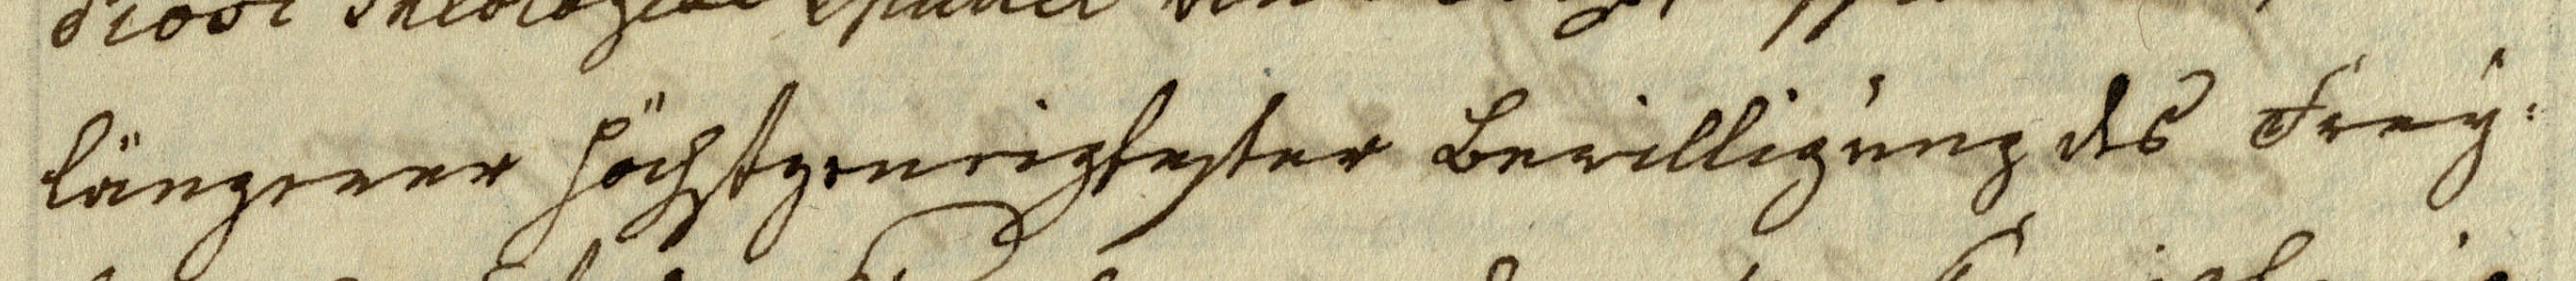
längerer höchstgeneigtester Bewilligung des Freÿ¬
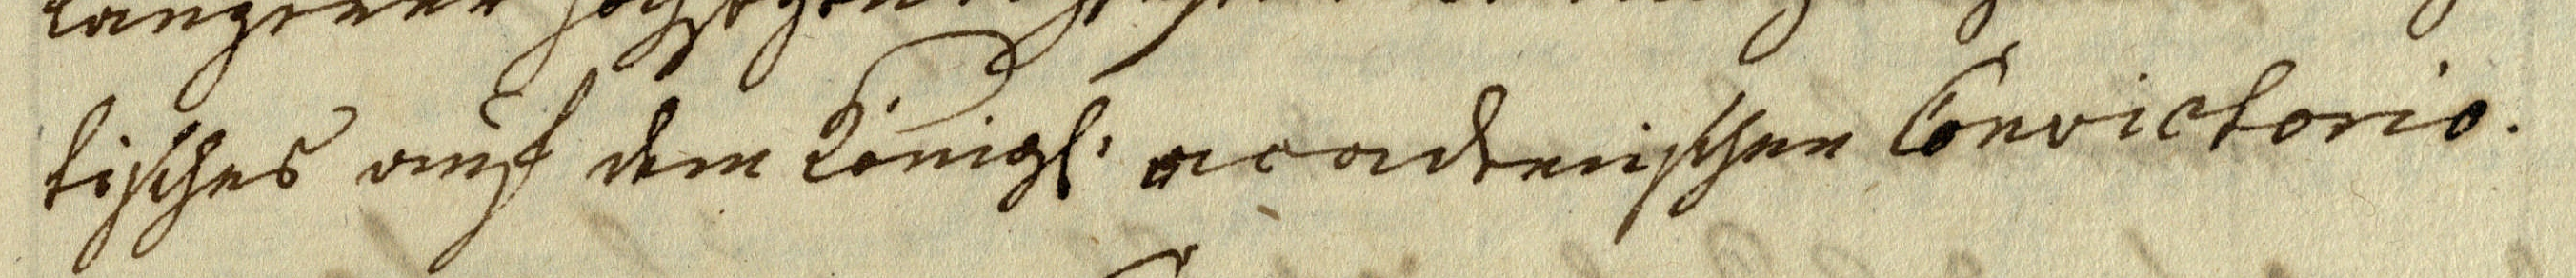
tisches auf dem Königl. academischen Convictorio.
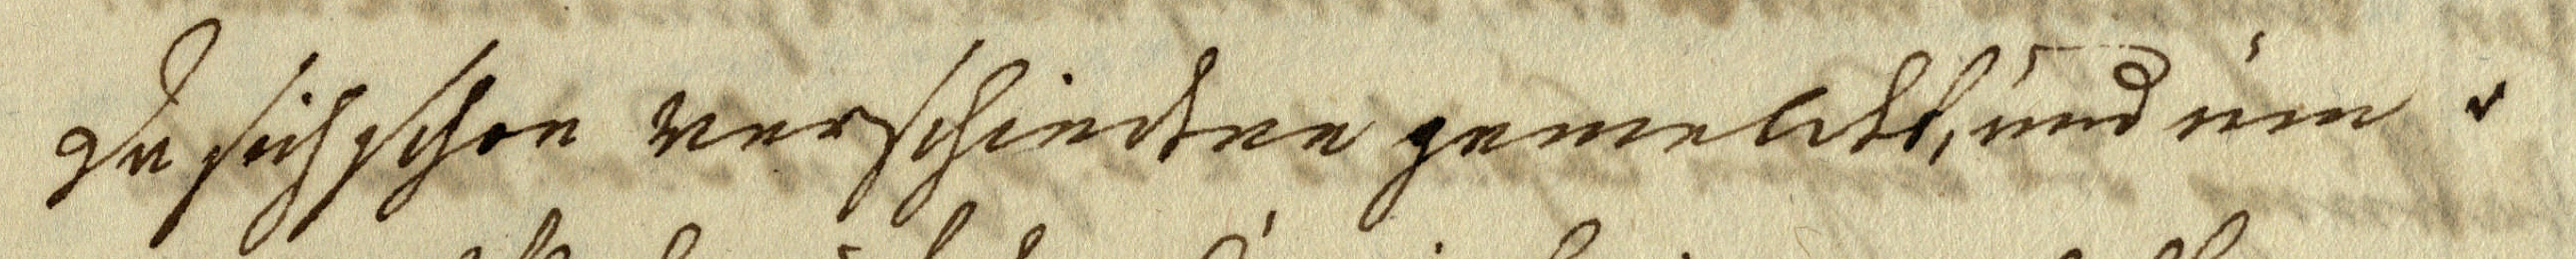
da sich schon verschiedene gemeldet, und um
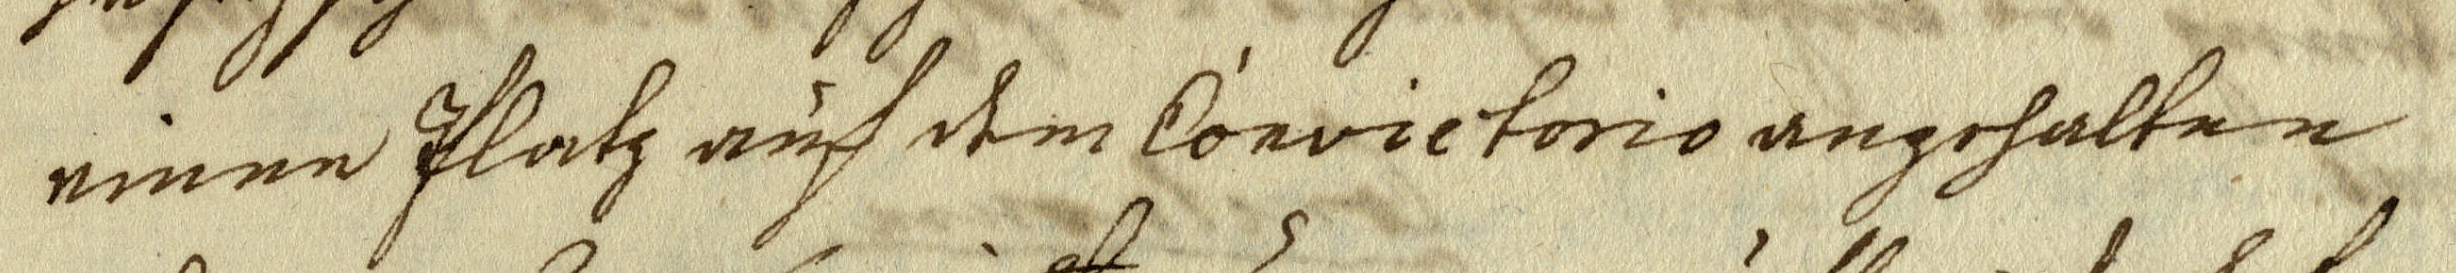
einen Platz auf dem Convictorio angehalten
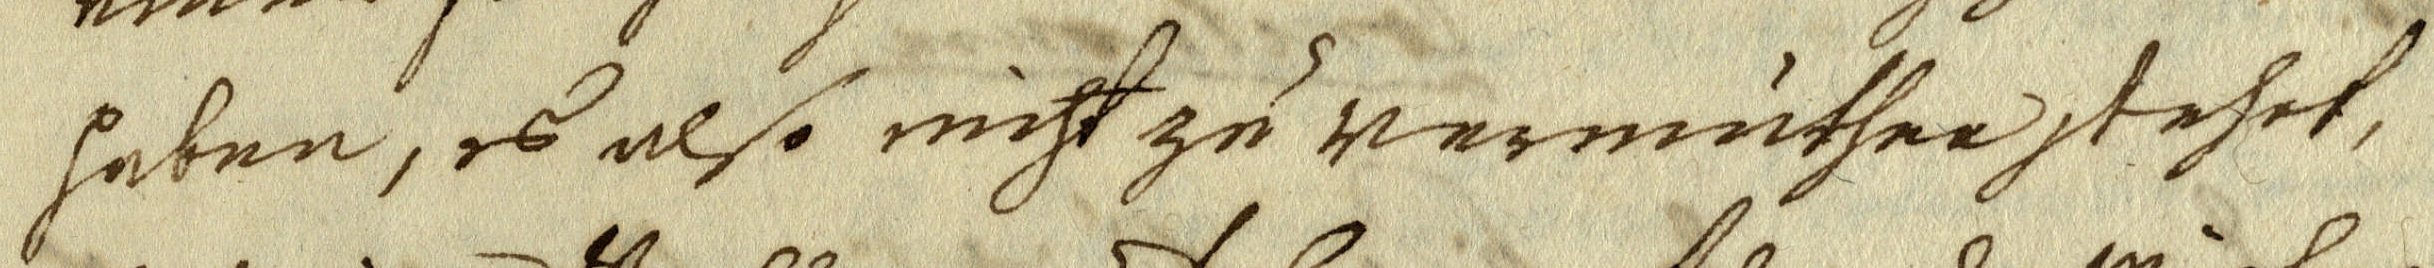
haben, es also nicht zu vermuthen stehet,
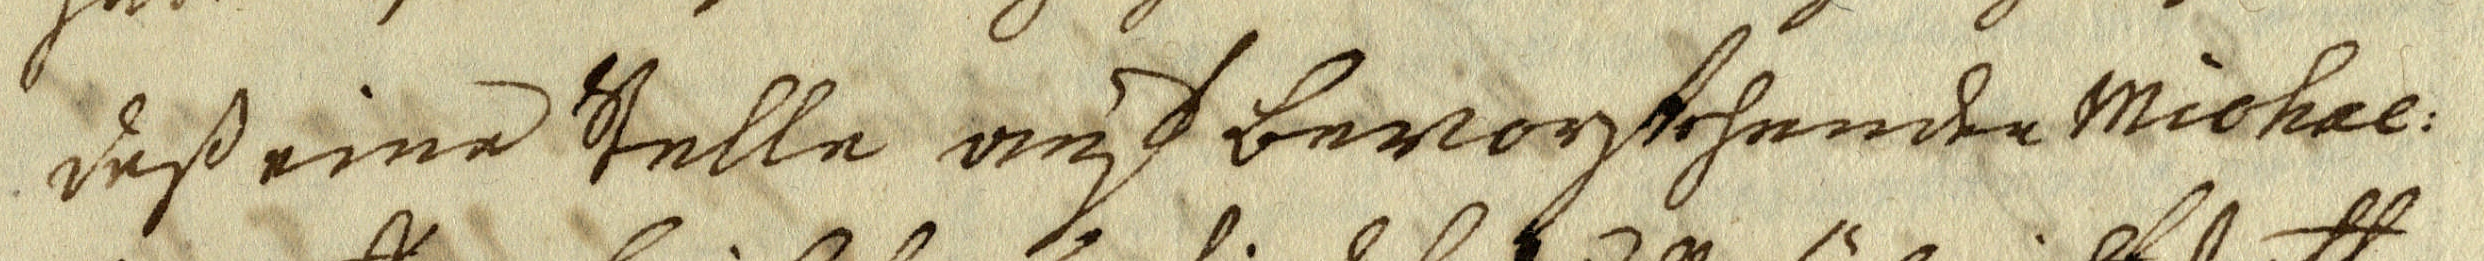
daß eine Stelle auf bevorstehenden Michae¬
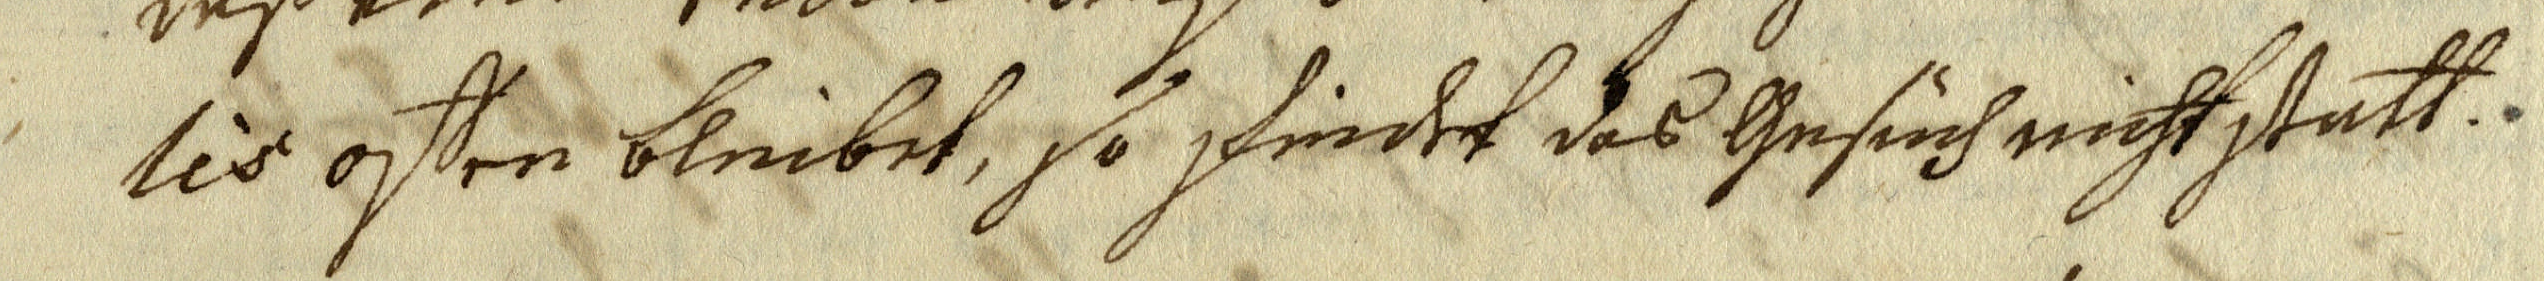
lis offen bleibet, so findet das Gesuch nicht statt.
